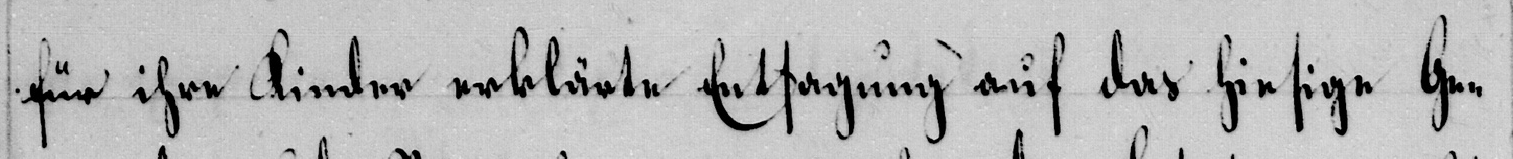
für ihre Kinder erklärte Entsagung auf das hiesige Ge¬
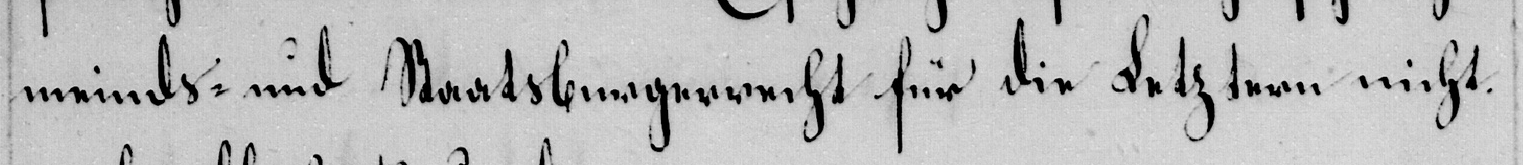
meinds- und Staatsbürgerrecht für die Letztern nicht
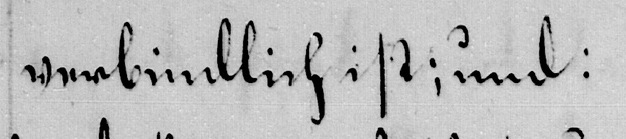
verbindlich ist; und:
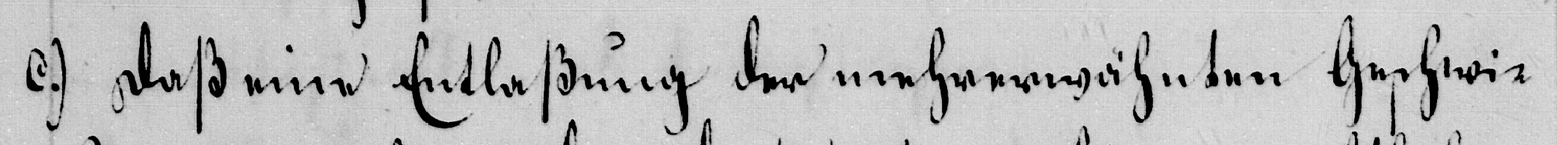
c.) Daß eine Entlaßung der mehrerwähnten Geschwis¬
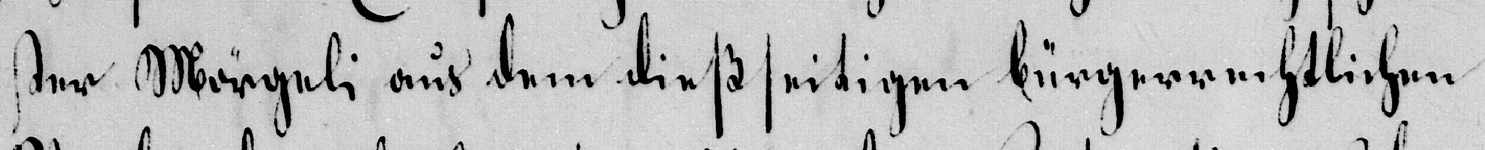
ter Mörgeli aus dem dießseitigen bürgerrechtlichen
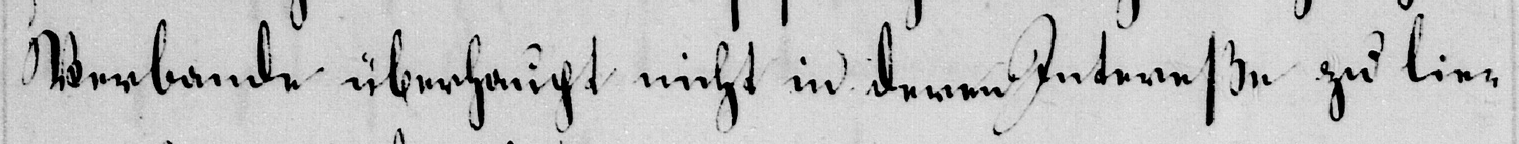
Verbande überhaupt nicht in deren Intereße zu lie¬
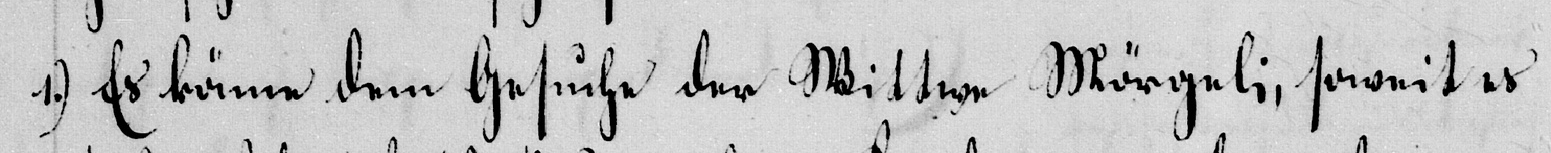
1.) Es könne dem Gesuche der Wittwe Mörgeli, soweit es
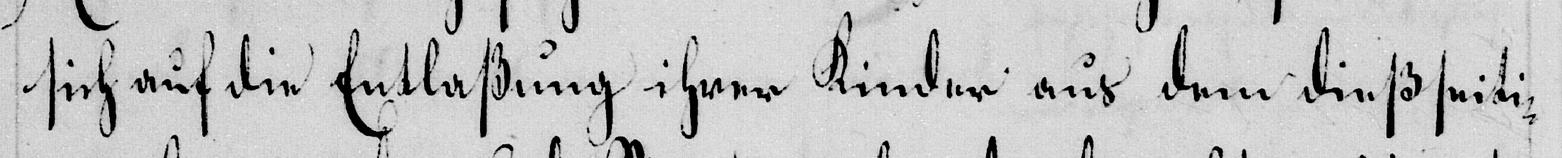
sich auf die Entlaßung ihrer Kinder aus dem dießseiti¬
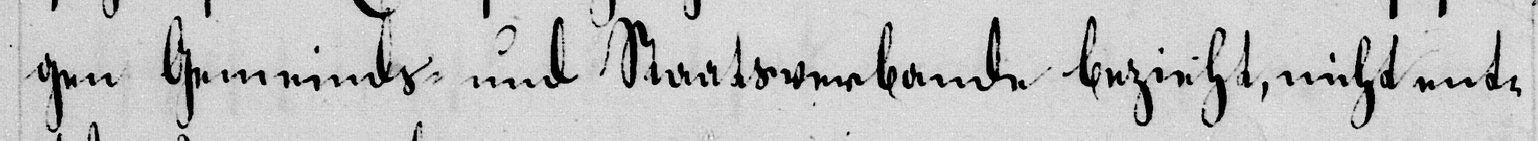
gen Gemeinds- und Staatsverbande bezieht, nicht ent¬
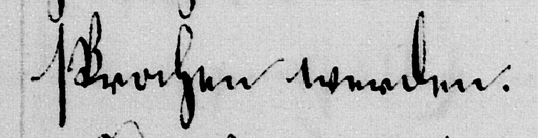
sprochen werden.
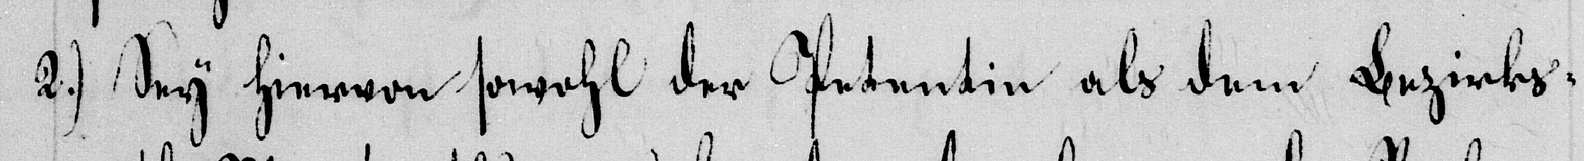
2.) Sey hiervon sowohl der Petentin als dem Bezirks¬
